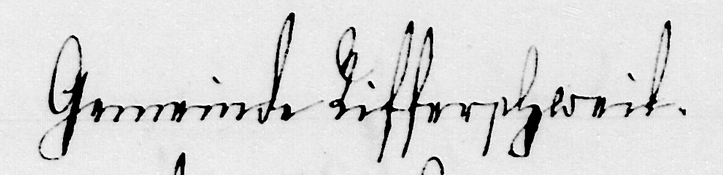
Gemeinde Rifferschweil.
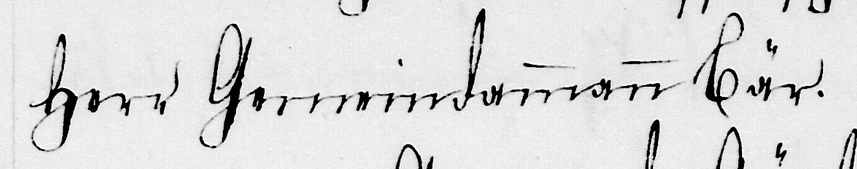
Herr Gemeindammann Bär.
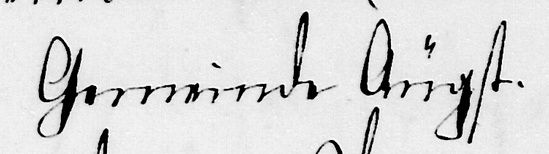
Gemeinde Äugst.
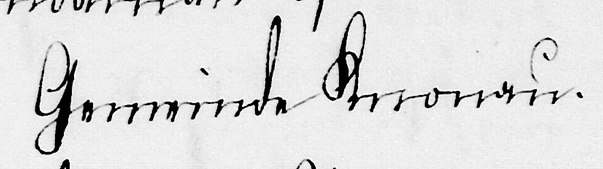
Gemeinde Knonau.
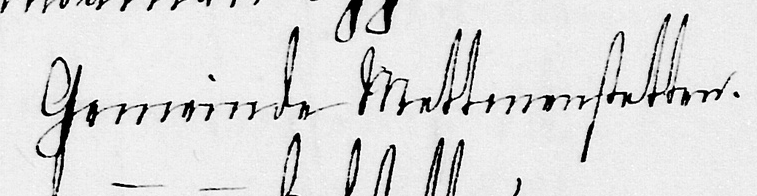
Gemeinde Mettmenstetten.
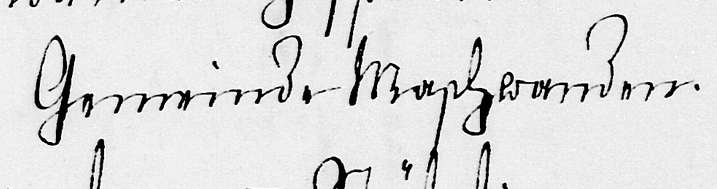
Gemeinde Maschwanden.
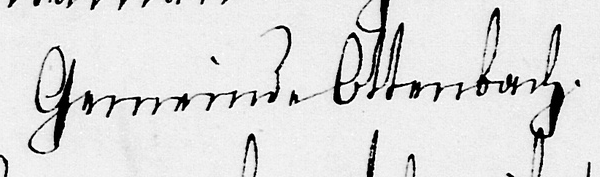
Gemeinde Ottenbach.
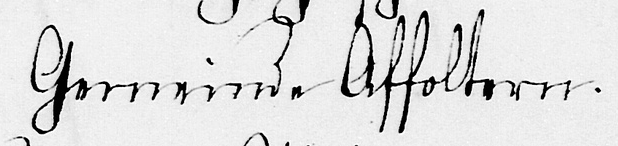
Gemeinde Affoltern.
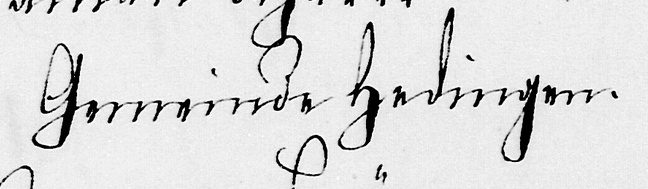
Gemeinde Hedingen.
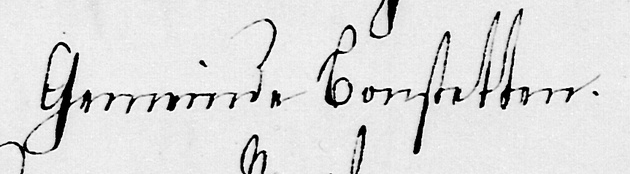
Gemeinde Bonstetten.
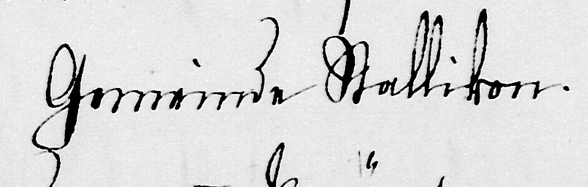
Gemeinde Stallikon.
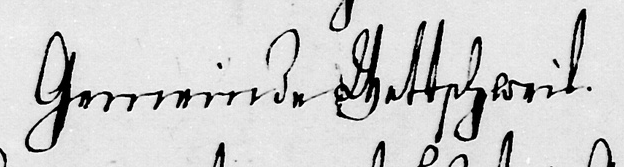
Gemeinde Wettschweil.
